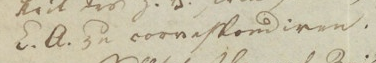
C.A. zu correspondiren.
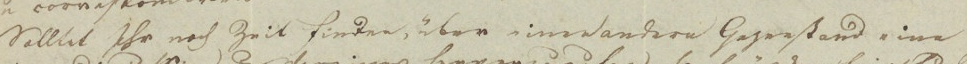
Solltet Ihr noch Zeit finden, über einen andern Gegenstand eine
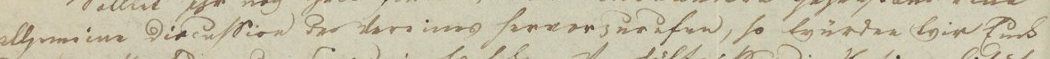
allgemeine Discussion des Vereines hervorzurufen, so würden wir Euch
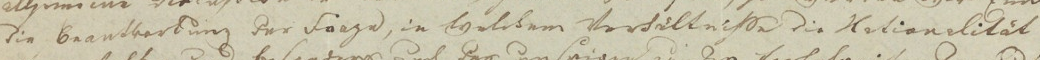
die Beantwortung der Frage, in welchem Verhältnisse die Nationalität
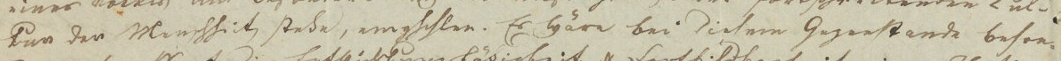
tur der Menschheit stehe, empfehlen. Es wäre bei diesem Gegenstande beson-
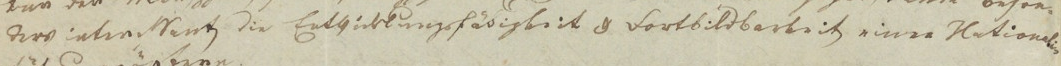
ders interessant, die Entwicklungsfähigkeit & Fortbildbarkeit einer Nationali-
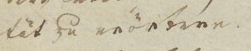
tät zu erörtern.
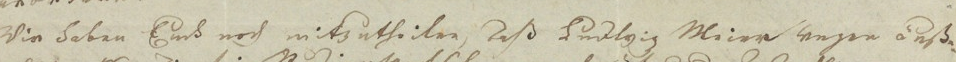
Wir haben Euch noch mitzutheilen, daß Ludwig Meier wegen äuße-
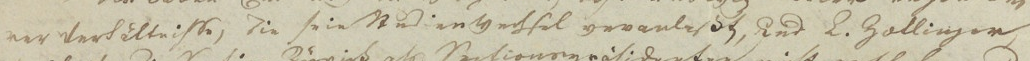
rer Verhältnisse, die sein Studienwechsel veranlaßt, und C. Zollinger,
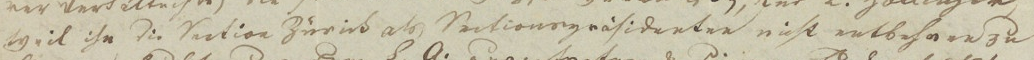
weil ihn die Section Zürich als Sectionspräsidenten nicht entbehren zu
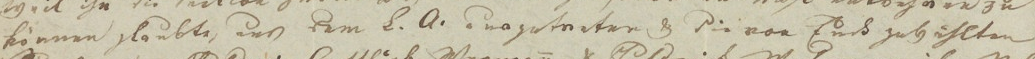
können glaubte, aus dem C.A. ausgetreten & die von Euch gewählten
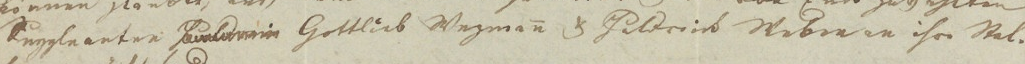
Suppleanten HuldreiGottlieb Wegmann & Huldreich Weber an ihre Stel-
